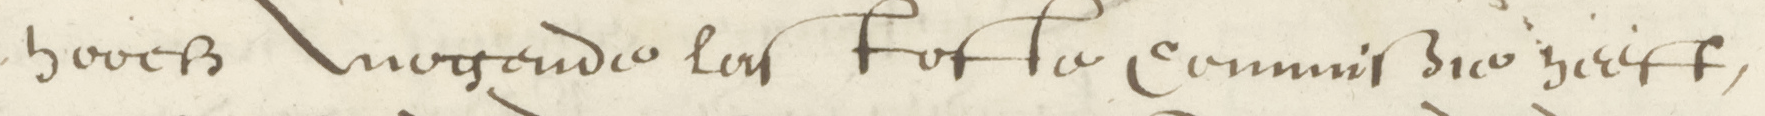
hooch mogende last ofte Commissie heeft,
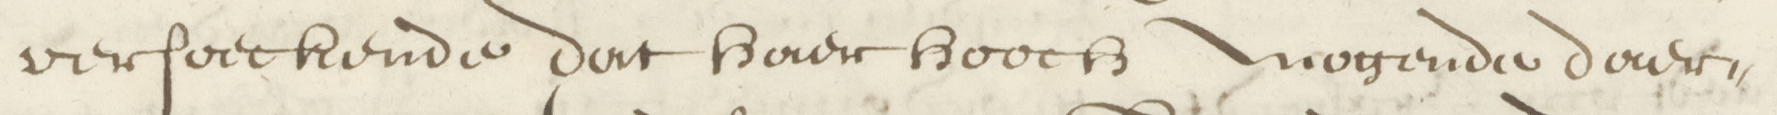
versoeckende dat haer hooch mogende daer„
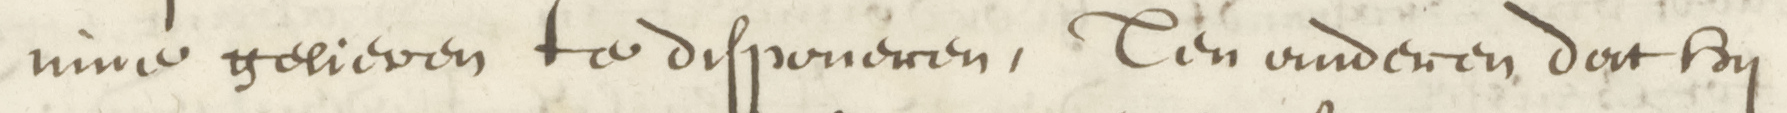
inne gelieven te disponeren. Ten anderen dat hy
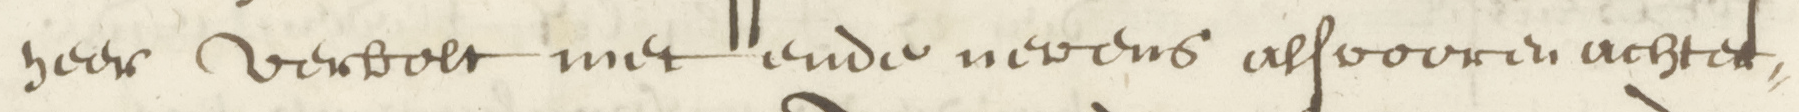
heer Verbolt met ende nevens alsvooren achter„
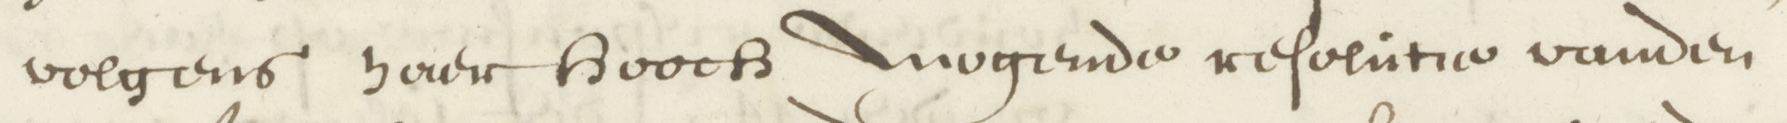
volgens haer hooch mogende resolutie vanden
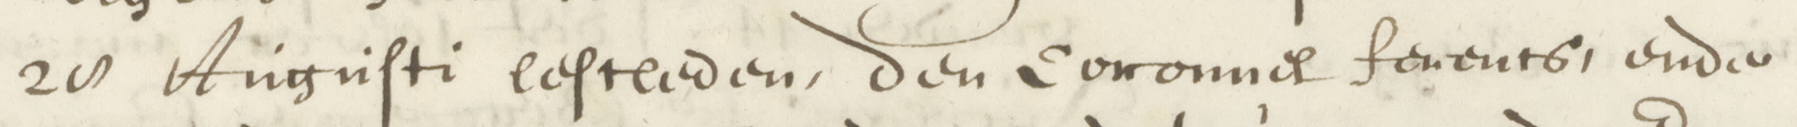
28 Augusti lestleden, den Coronnel ferents, ende
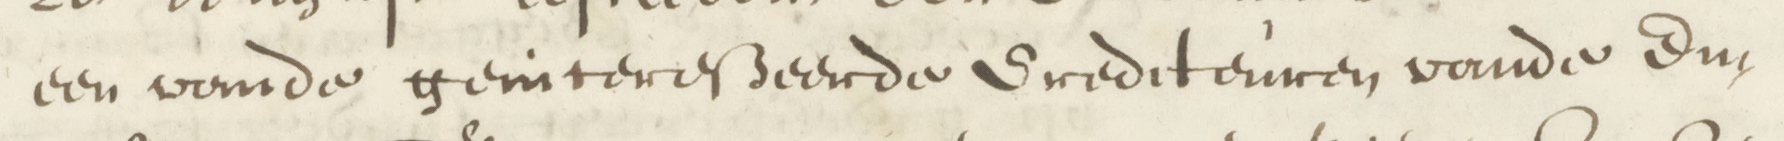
een van de geintereseerde Crediteuren vande En,,
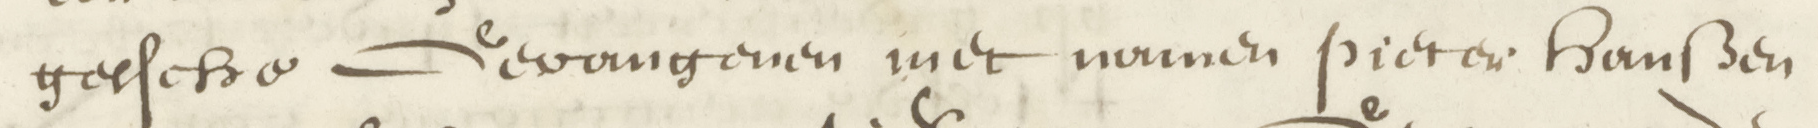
gelsche Gevangenen net namen pieter hanszen
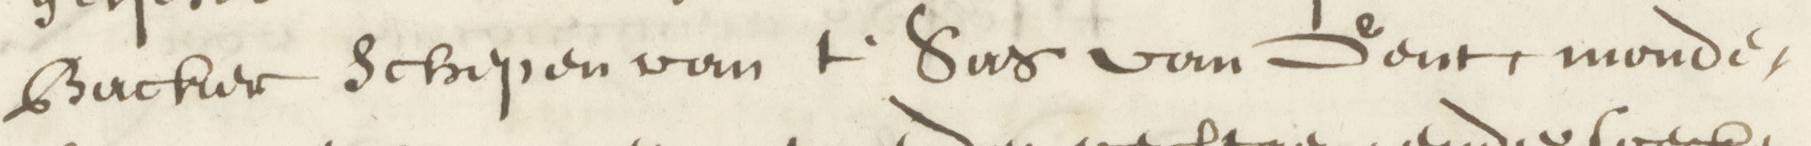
Backer schepen van t' Sas van Gent, monde,
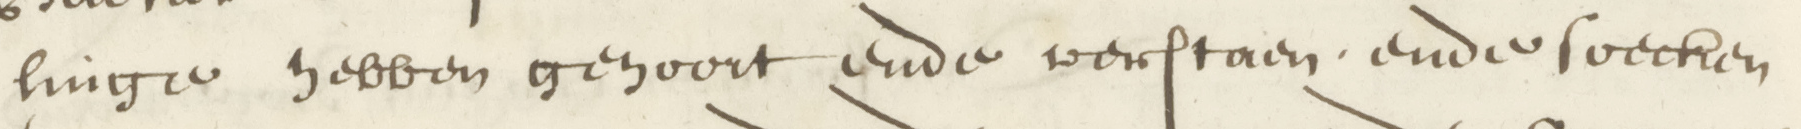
linge hebben gehoort ende verstaen, ende soecken
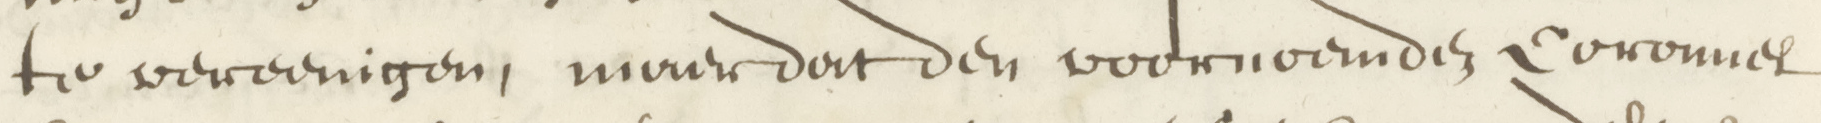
te vereenigen, maer dat den voornoemden Coronnel
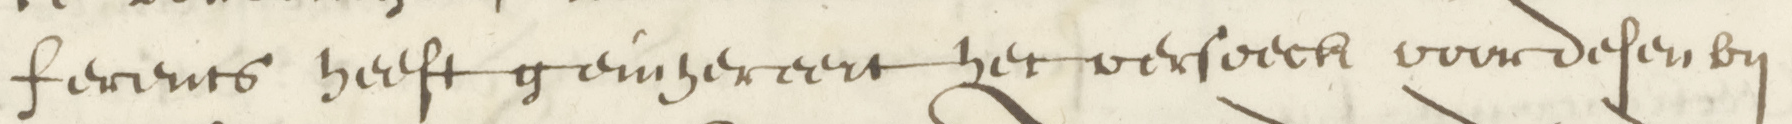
ferents heeft geinhereert het versoeck voor desen by
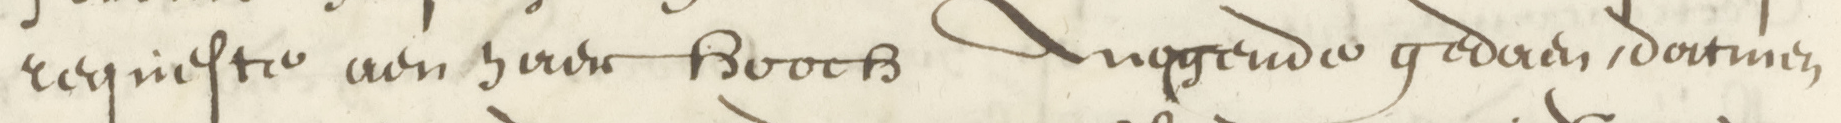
requeste aen haer hooch Mogende gedaen, dat men
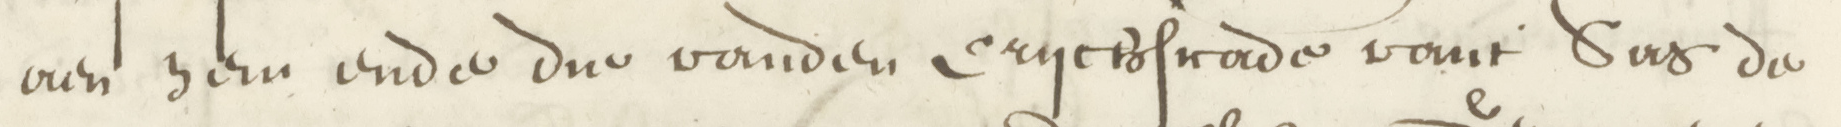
aen hem ende die vanden Crychsrade vant' Sas de
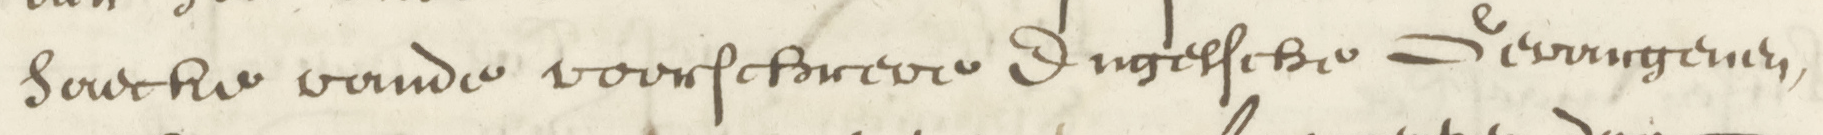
saecke vande voorschreve Engelsche Gevangenen,
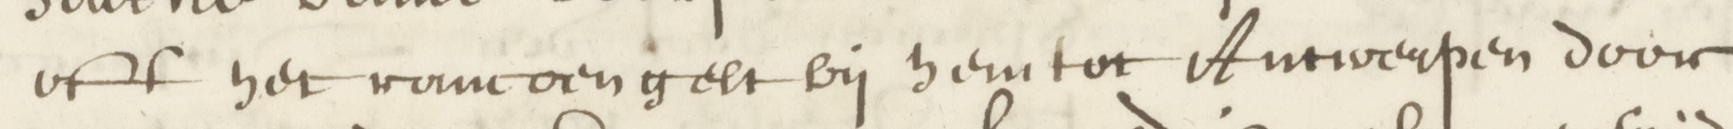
off het rancoengelt bij hem tot Antwerpen door
